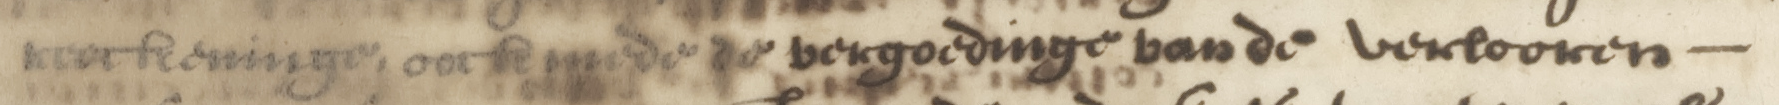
reeckeninge, oock mede de vergoedinge van de verlooren -
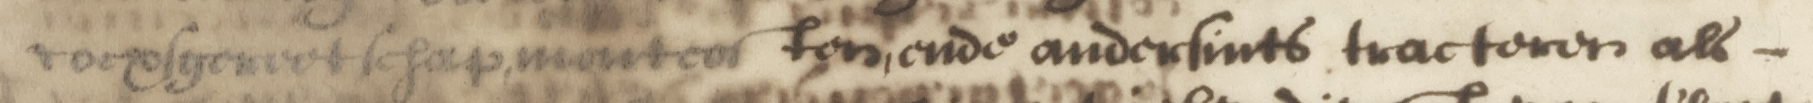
cocxgereetschap, montcosten ende andersints tracteren als -
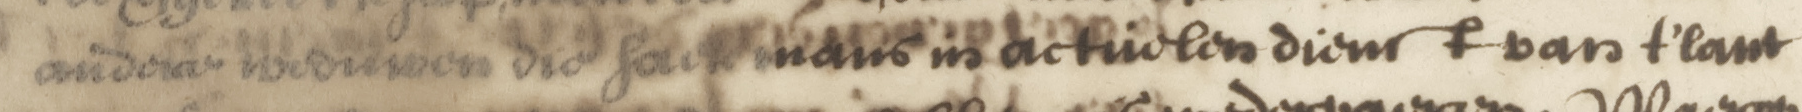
andere weduwen die haer mans in actuelen dienst van t'lant
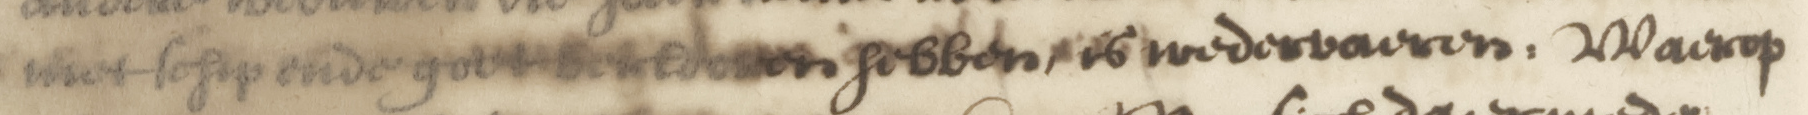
met schip en goet verlooren hebben, is wedervaeren. Waerop
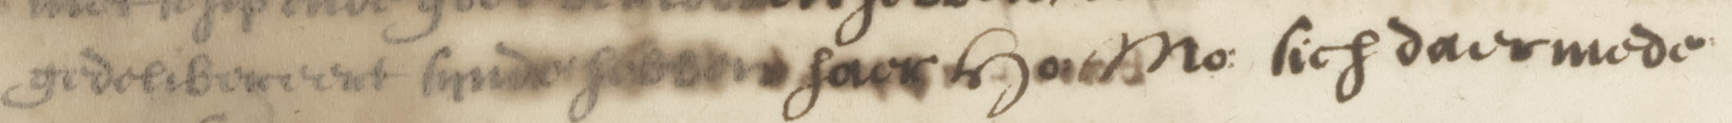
gedelibereert synde hebben haer Ho:Mo: sich daermede
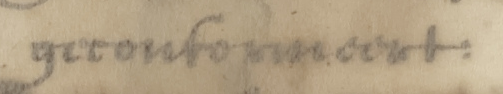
geconformeert.
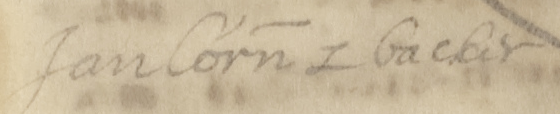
Jan Cornz backer
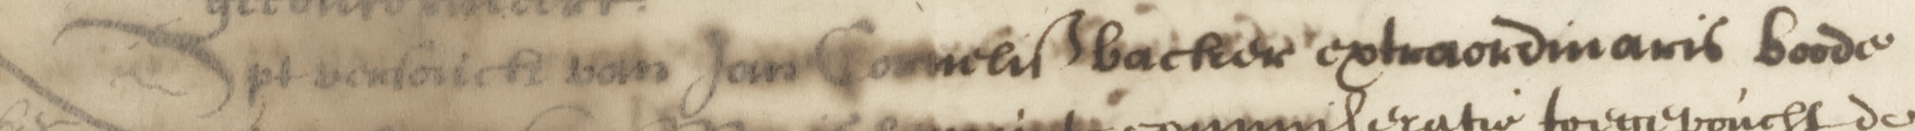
Opt versouck van Jan Cornelis backer extraordinaris boode
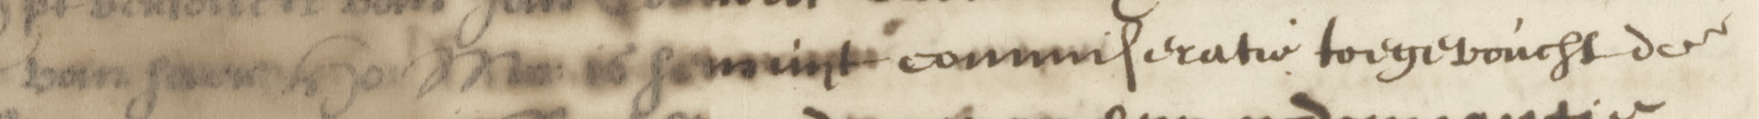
van haer Ho:Mo: is hem uyt commiseratie toegevoucht de
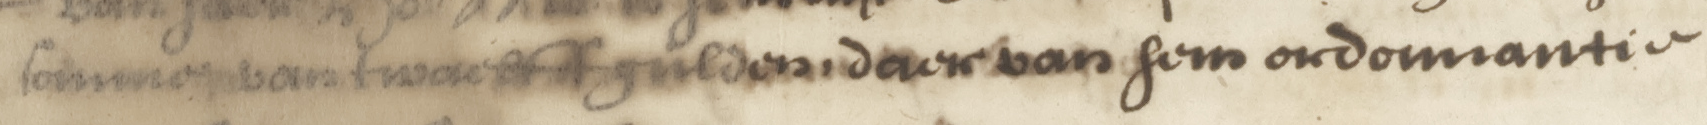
somme van twaelff gulden daervan hem ordonnantie
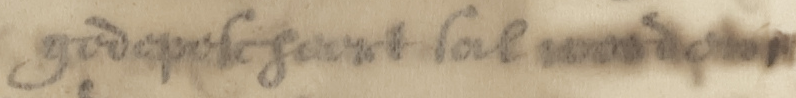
gedepescheert sal worden.
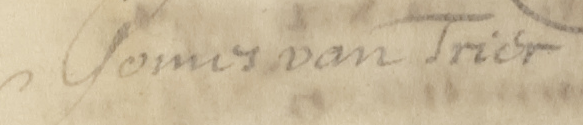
Gomes van Trier
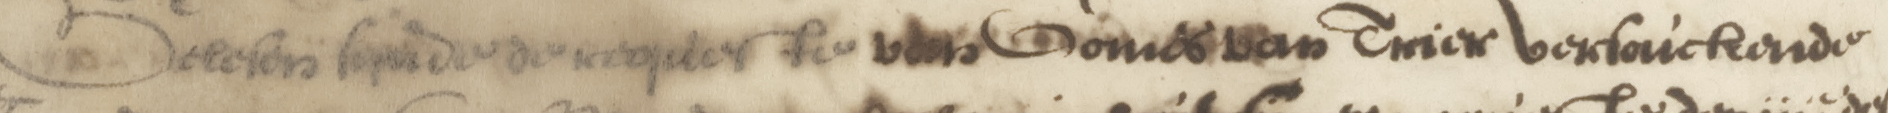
Gelesen synde requeste van Gomes van Trier versouckende
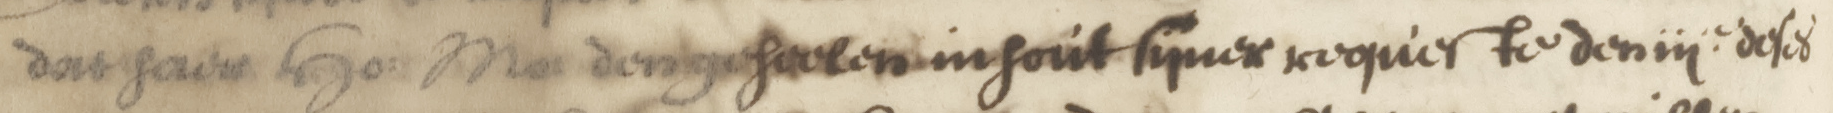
dat haer Ho:Mo: den geheelen inhout sijner requeste den iije. deses
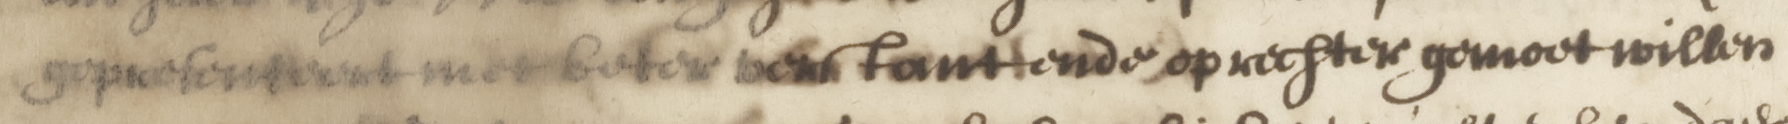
gepresenteert met beter verstant ende op rechter gemoet willen
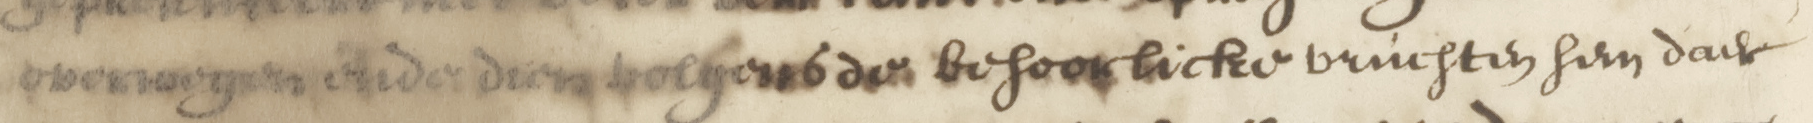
overwegen ende dienvolgens de behoorlicke vruchten hem daer
